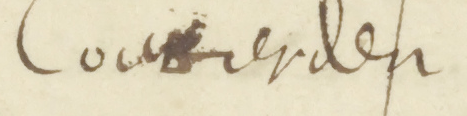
Coeverden
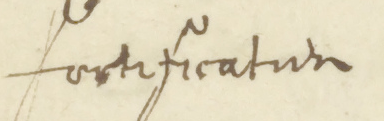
fortificatien
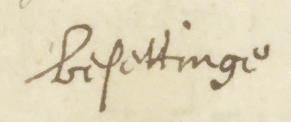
besettinge
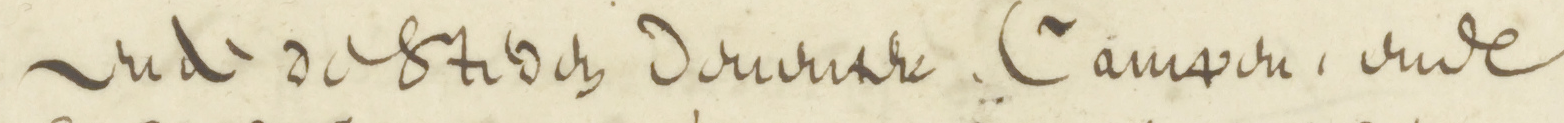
ende de Steden Deuenter, Campen, ende
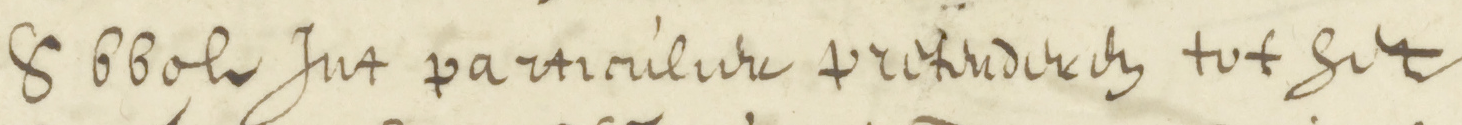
Swol Int particulier pretenderen tot het
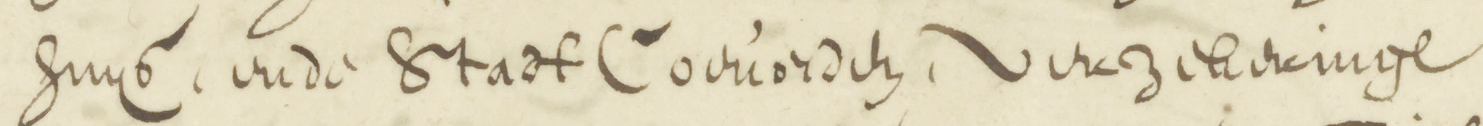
huys, ende Stadt Coevorden, verzekeringe
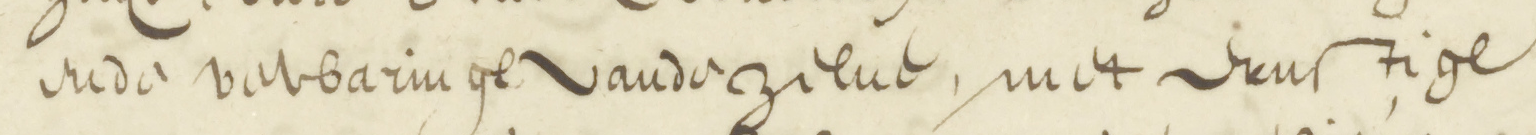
ende vewaringe vande zelue, met ernstige
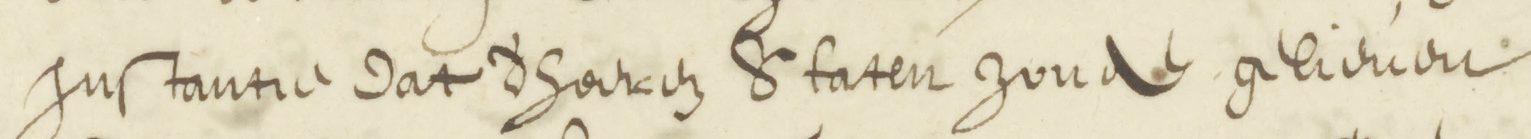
Instantie dat d'heeren Staten zoude gelieuen
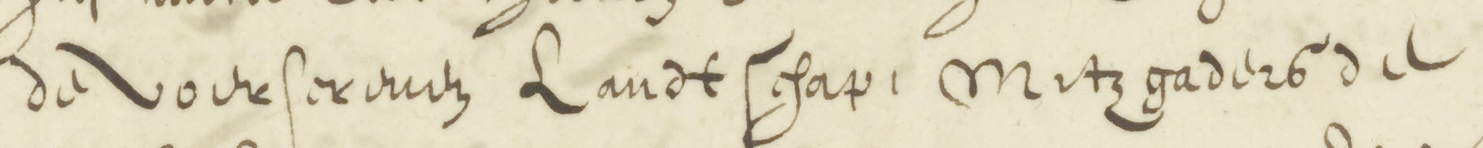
de voerscreuen Landtschap, mitzgaders de
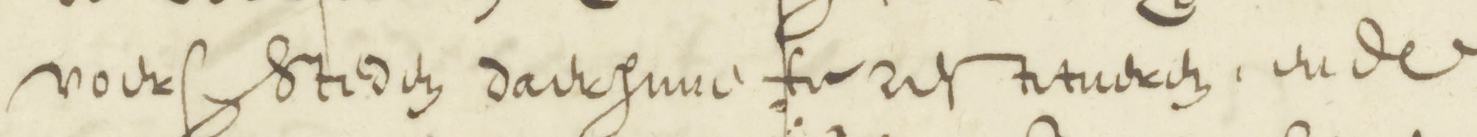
voers steden daerinne te restitueren, ende
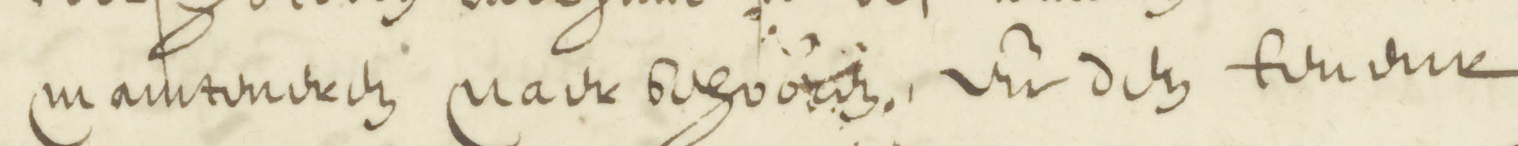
mainteneren naer behooren, en den teneur
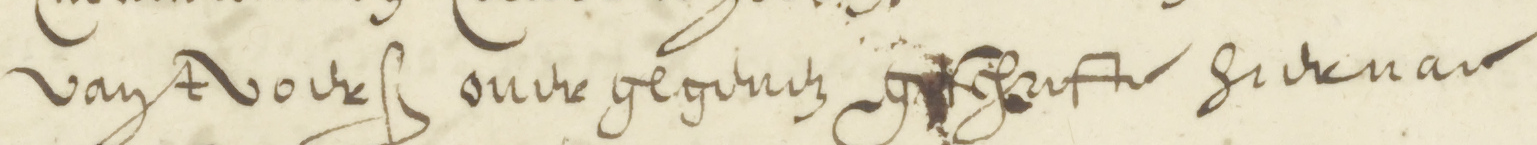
van t voers ouer gegeuen geschrifte hiernae
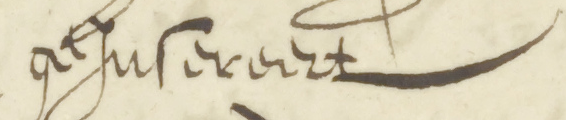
geinsereert
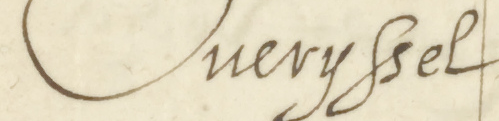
Overyssel
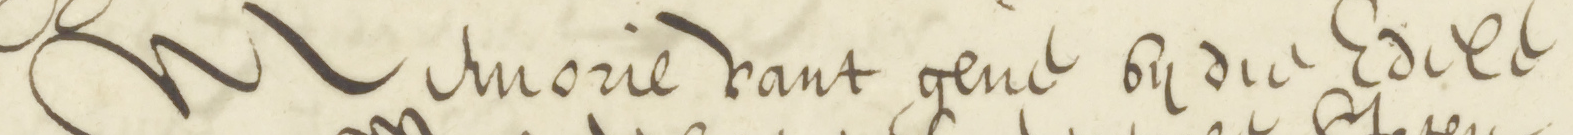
Memorie vant gene by die Edele
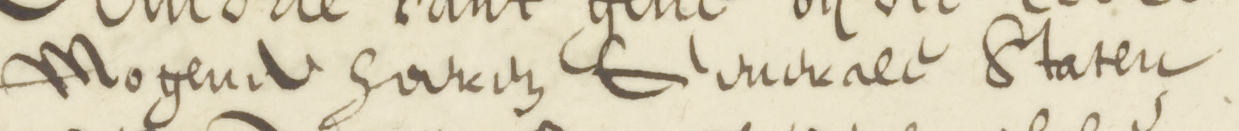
Mogende heeren Generale Staten
